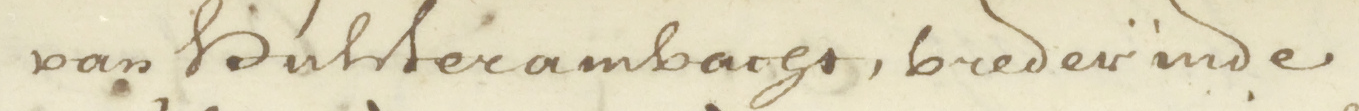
van Hulsterambacht, breder inde
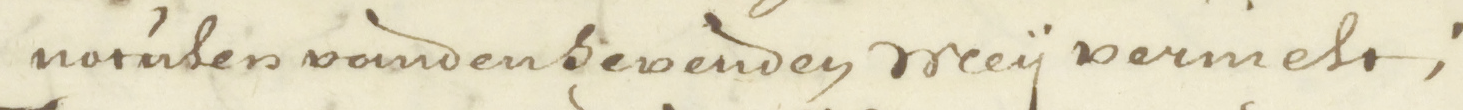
notulen vanden sevenden Meij vermelt;
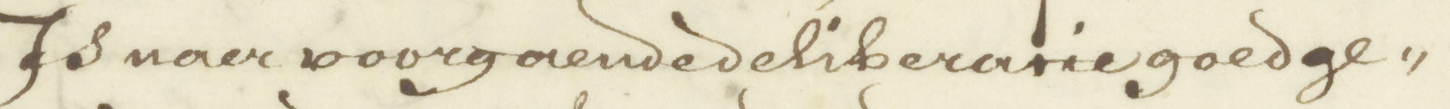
Is naer voorgaende deliberatie goedge„
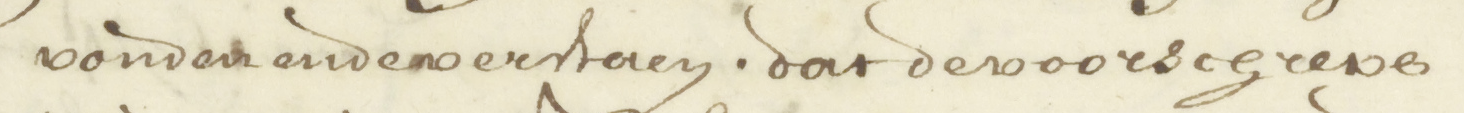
vonden ende verstaen dat de voorschreve
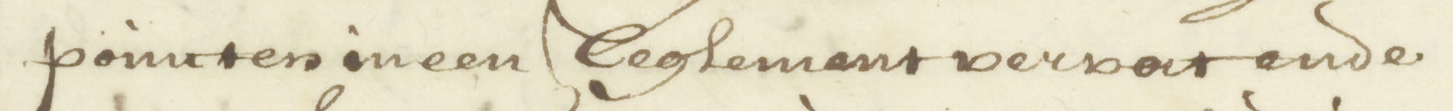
poincten in een Reglement vervat ende
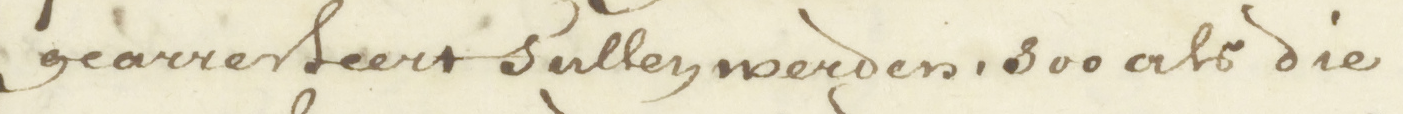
gearresteert sullen werden, soo als die
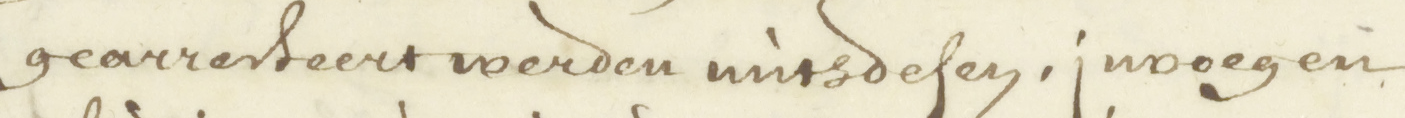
gearresteert werden mitsdesen, invoegen
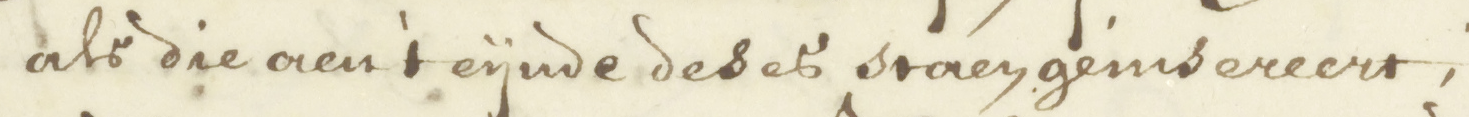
als die aen ‛t eijnde deses staen geinsereert;
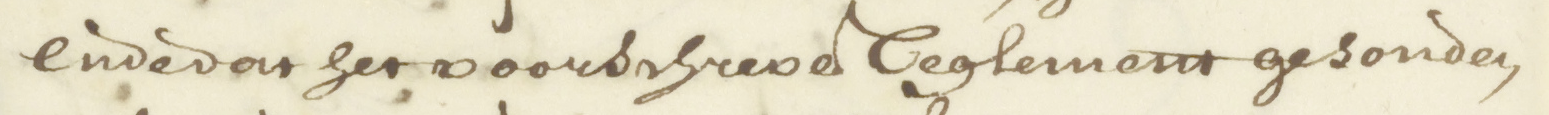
ende dat het voorschreve Reglement gesonden
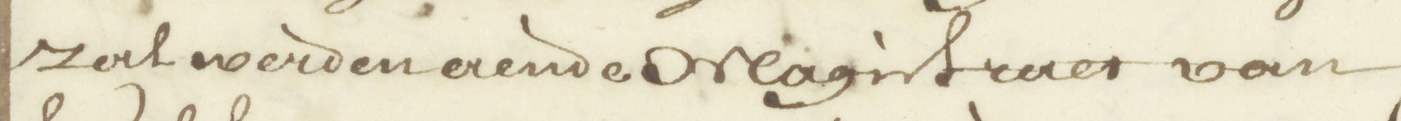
zal werden aende Magistaet van
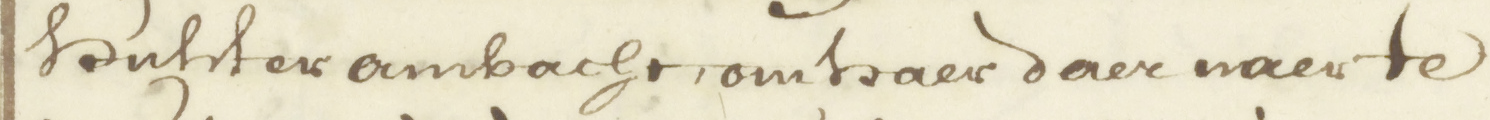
Hulster ambacht, om haer daer naer te
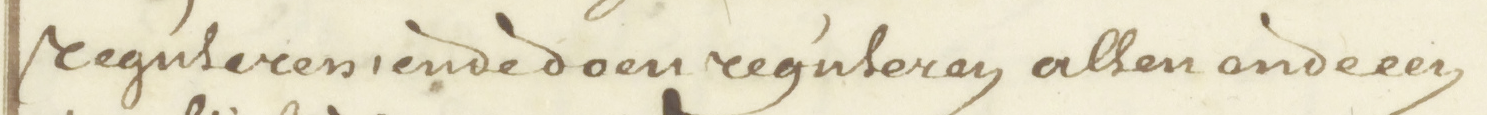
reguleren, ende doen reguleren allen ende een
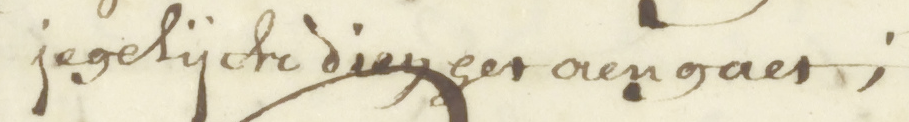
iegelijck dien het aengaet.
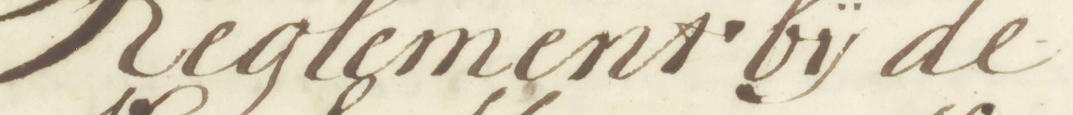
Reglement bij de
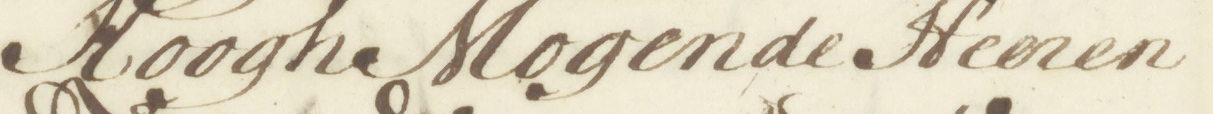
Hoogh Mogende Heeren
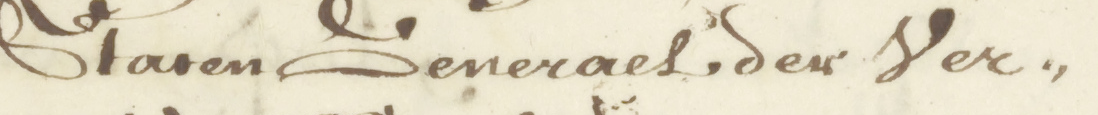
Staten Generael der Ver„
